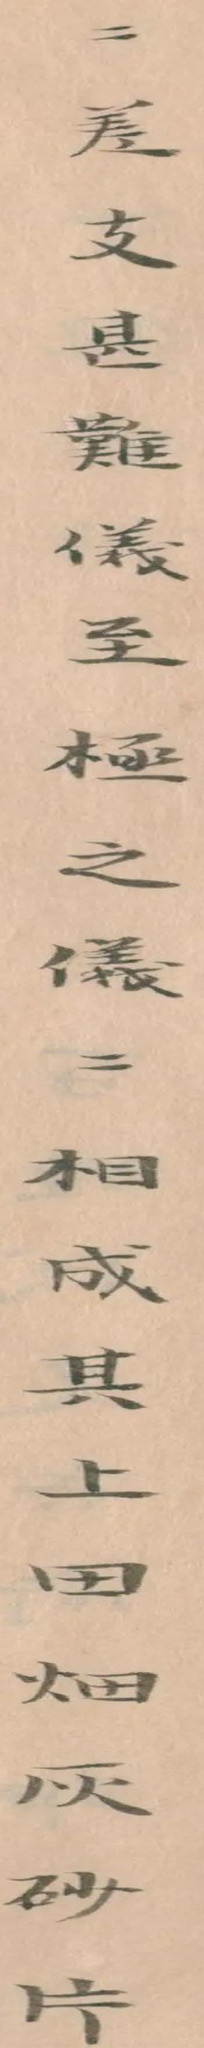二差支甚難儀至極之儀二相成其上田畑灰砂片
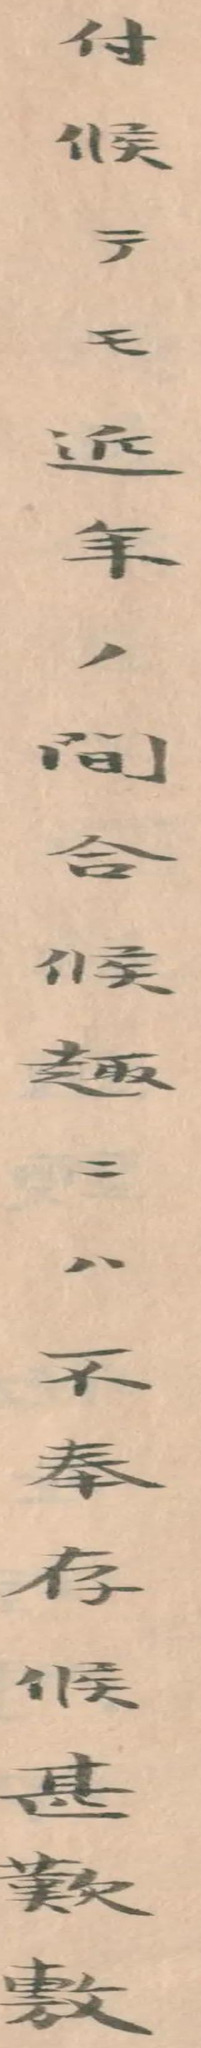付候テモ近年ノ間合候趣ニハ不奉存候甚歎敷
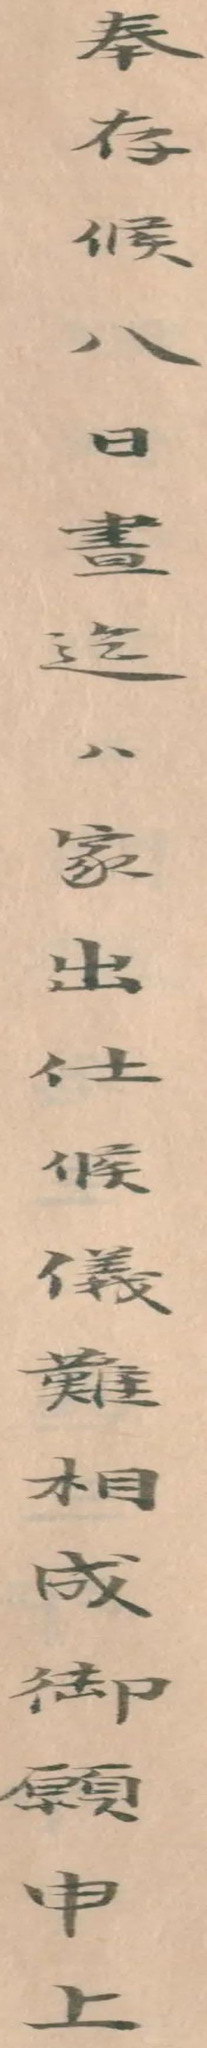奉存候八日晝迄ハ家出仕候儀難相成御願申上
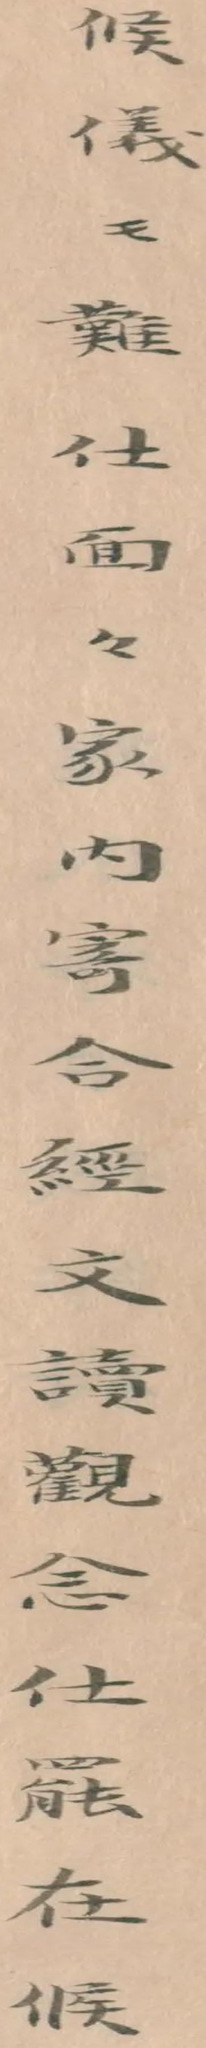候儀モ難仕面々家内寄合経文読観念仕罷在候
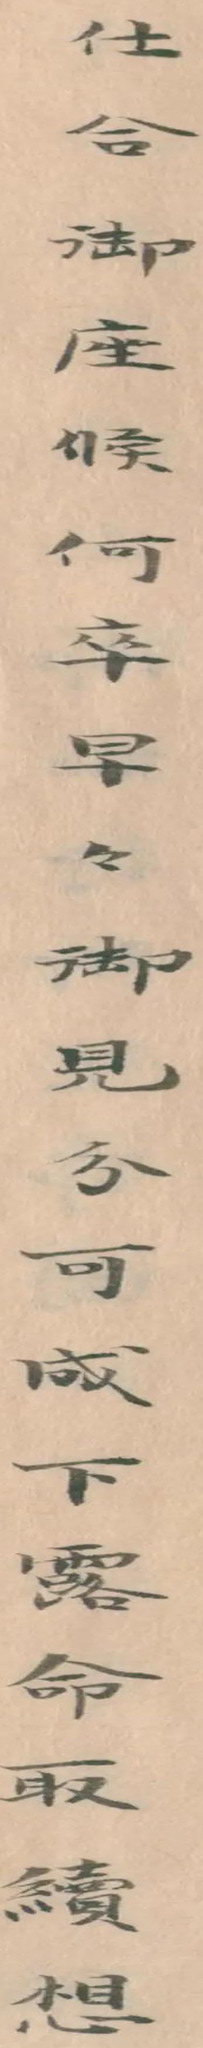仕合御座候何卒早々御見分可成下露命取続想
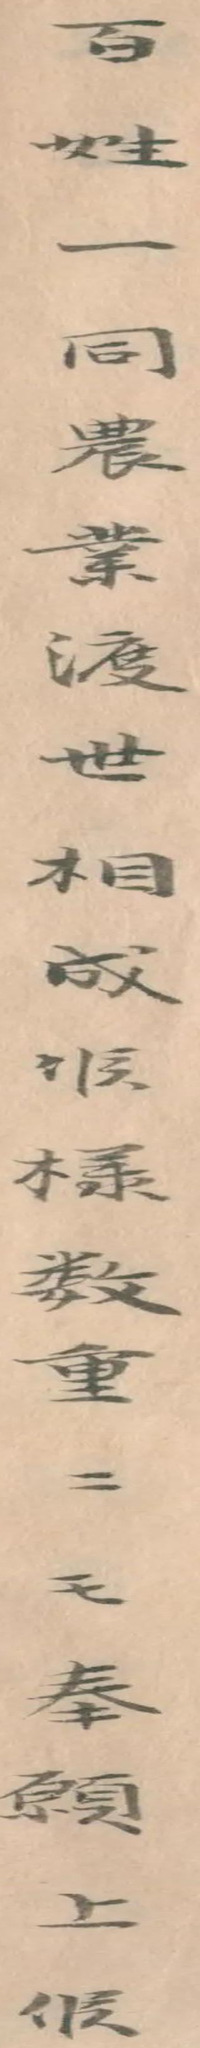百姓一同農業渡世相成候様数重ニモ奉願上候

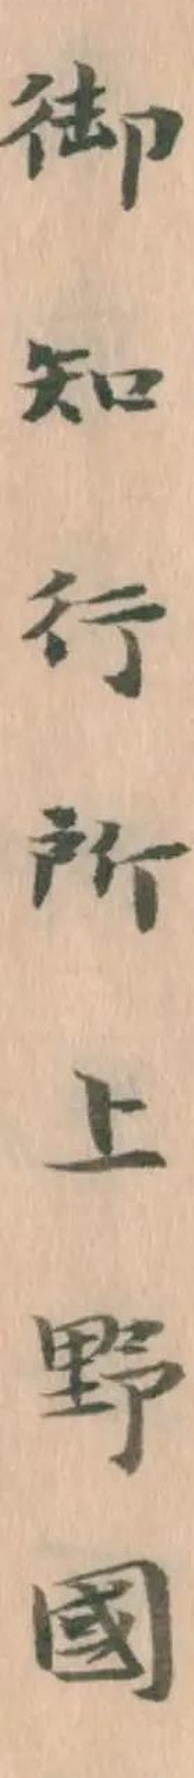御知行所上野国
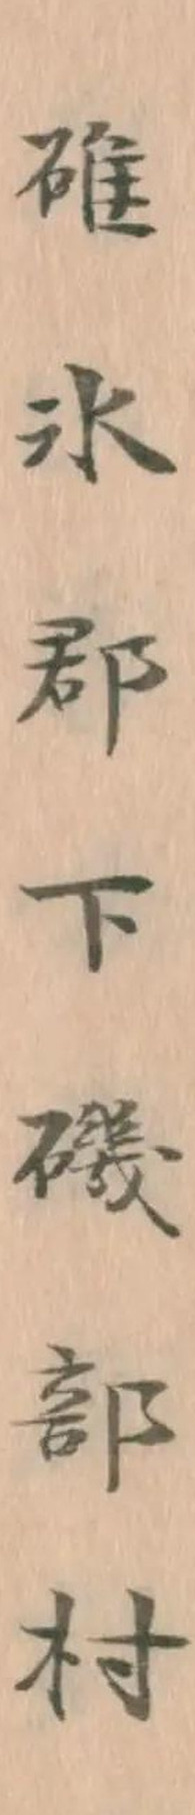碓井郡下磯部村
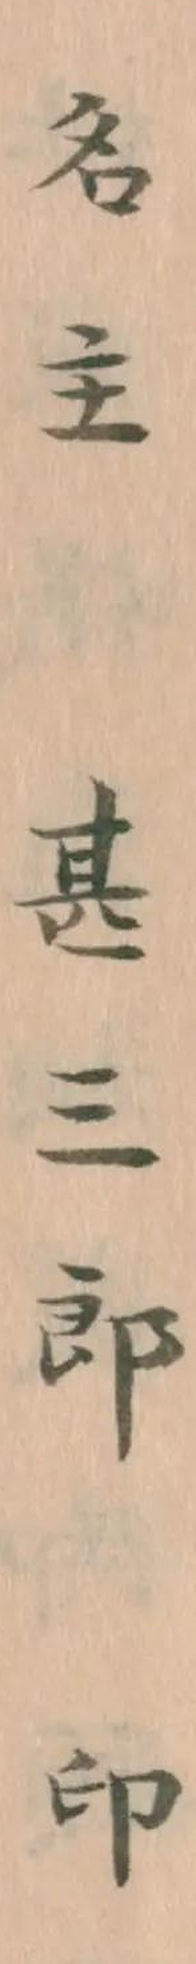名主甚三郎印
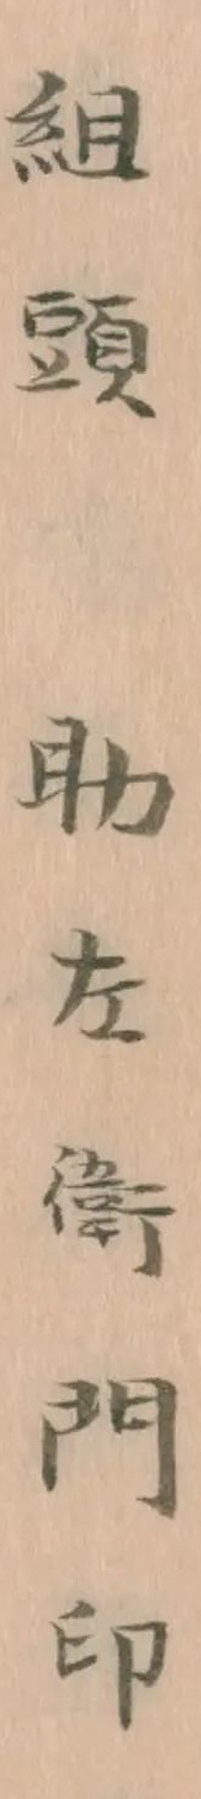組頭助左衛門印
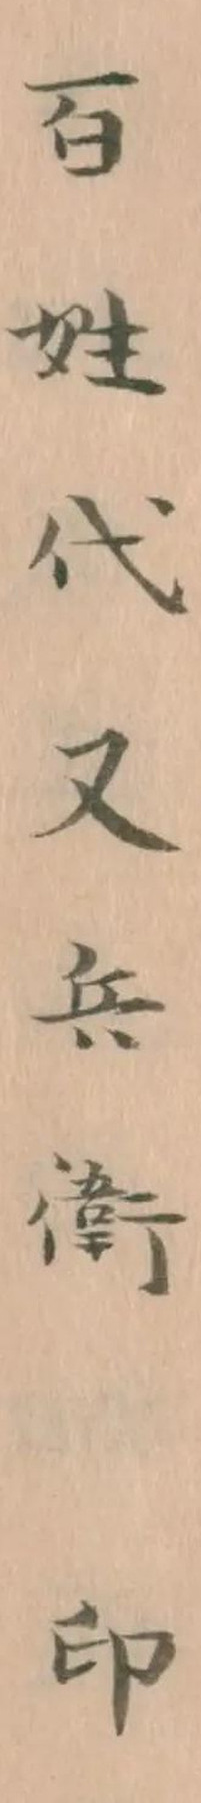百姓代又兵衛印
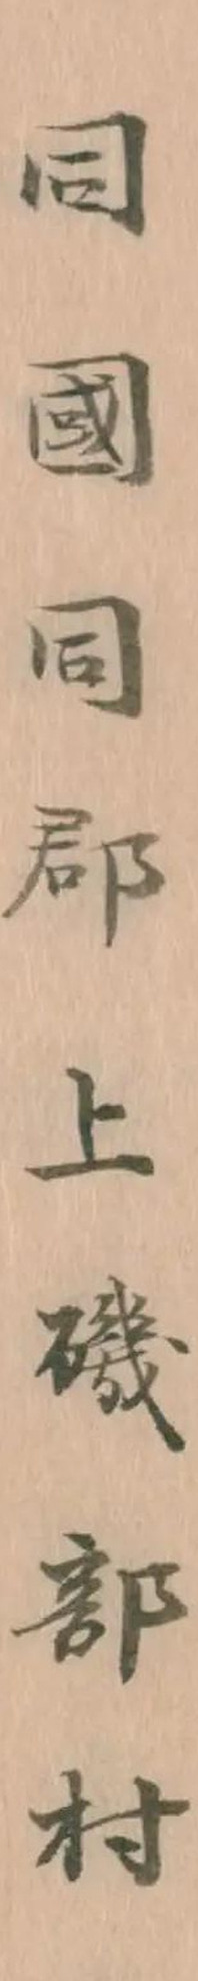同国同郡上磯部村
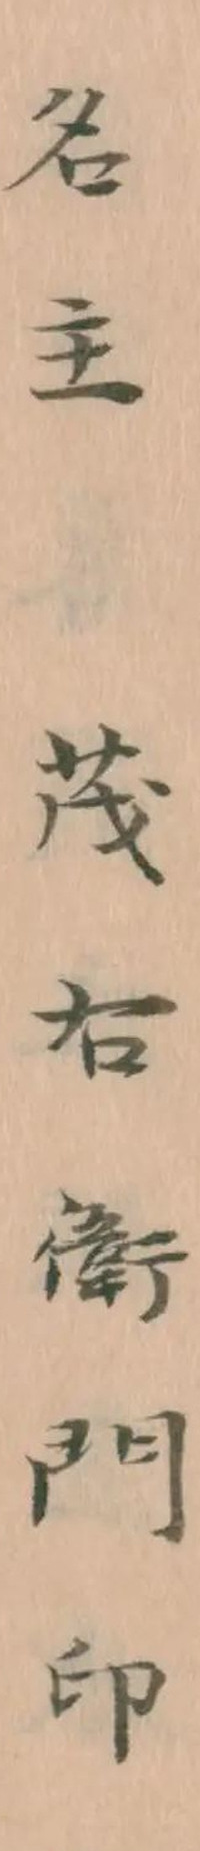名主茂右衛門印
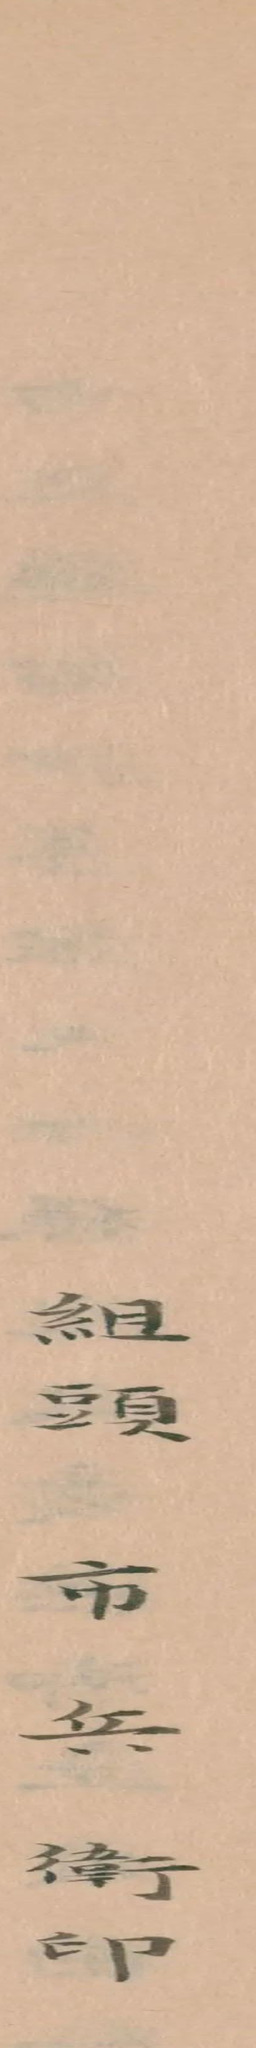組頭市兵衛印
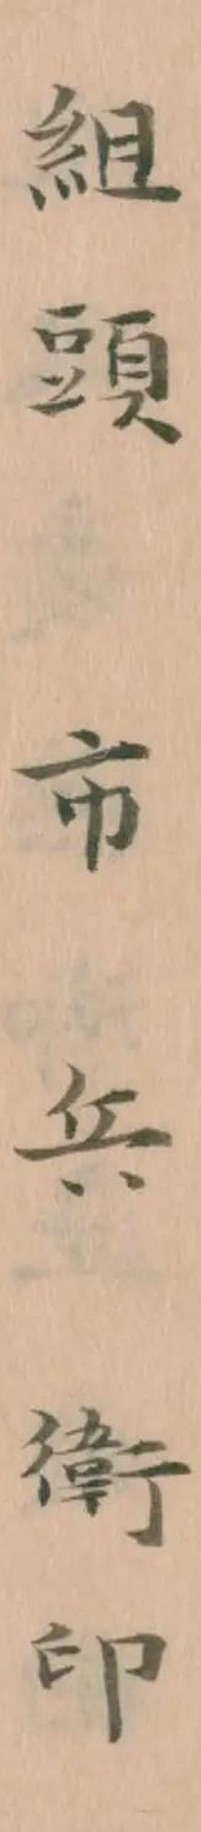組頭市兵衛印
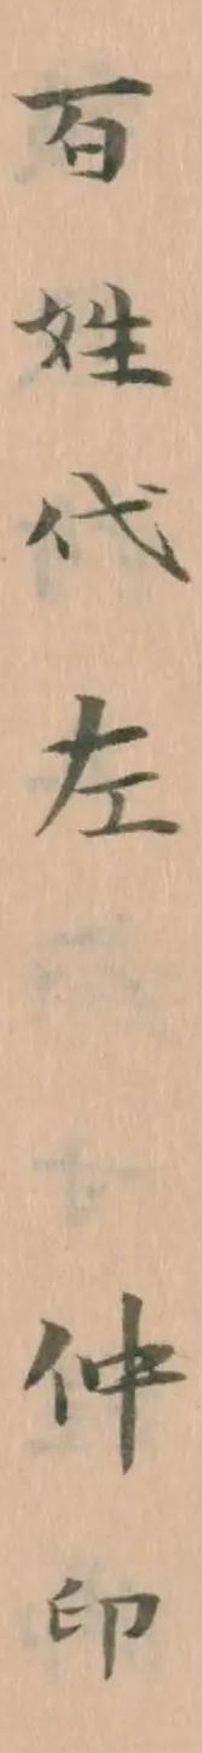百姓代左仲印
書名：地災撮要. 巻1(噴火山・地震ノ部)
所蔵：国立国会図書館 National Diet Library, JAPAN
